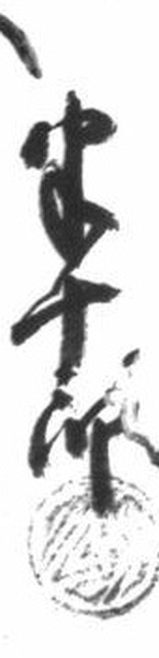半十郎
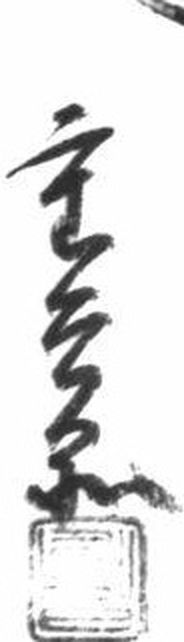重兵衛
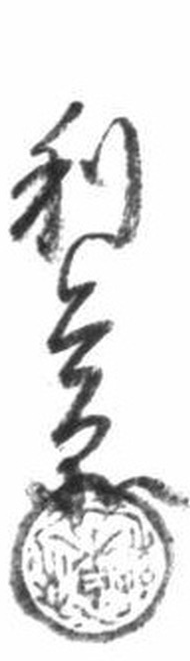利兵衛
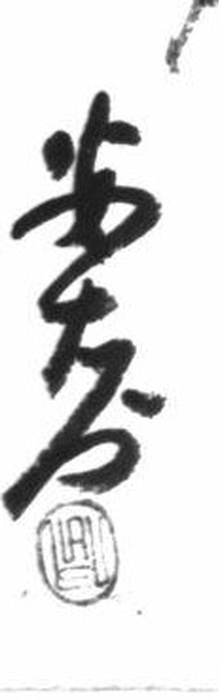安右衛門
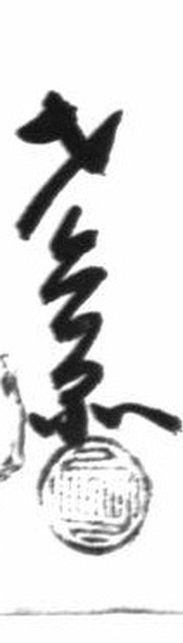才兵衛
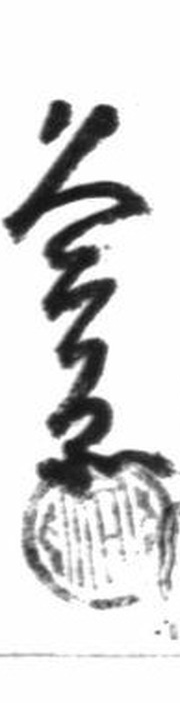久兵衛
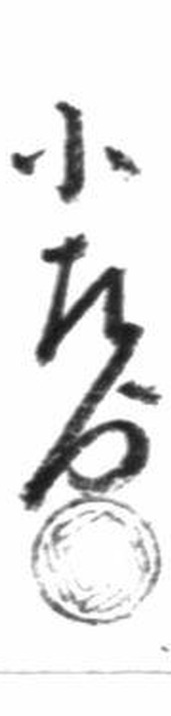小左衛門
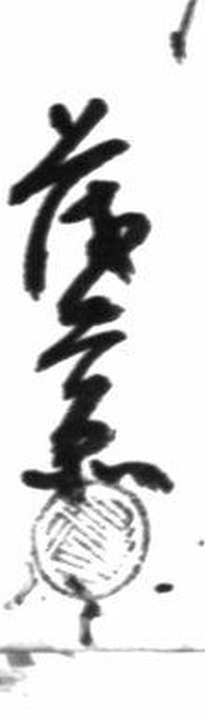茂兵衛
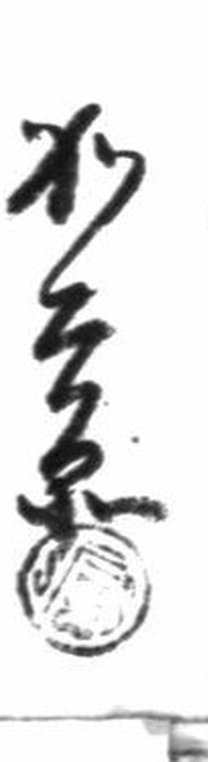利兵衛
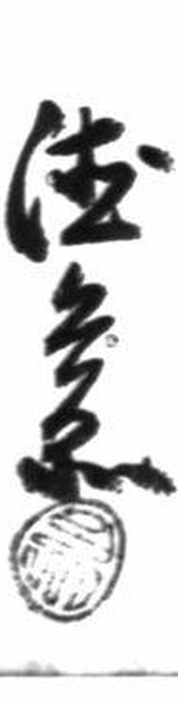徳兵衛
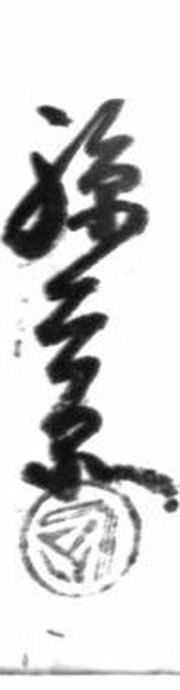孫兵衛
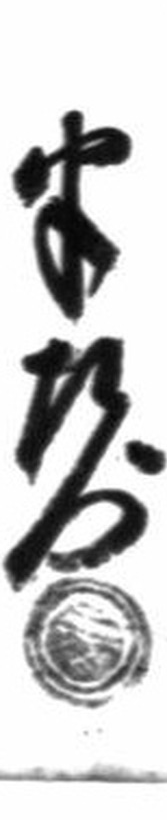半左衛門

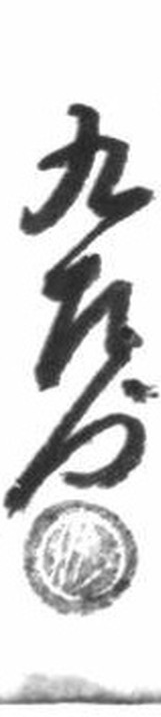九左衛門
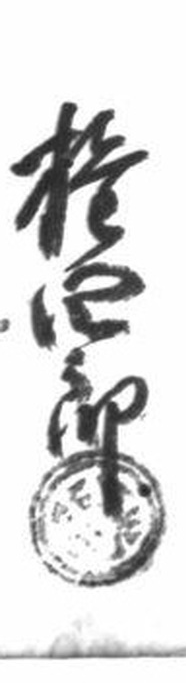権四郎
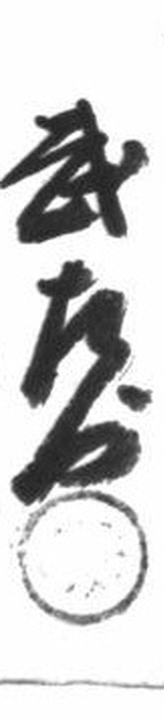武左衛門
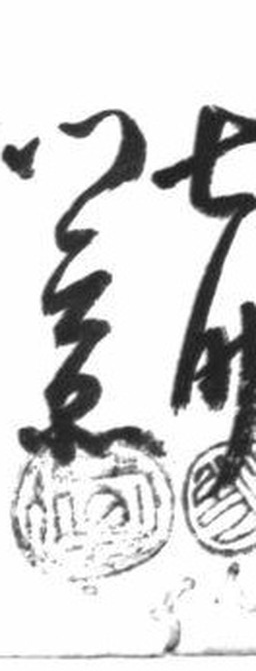門兵衛
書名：宝永弐酉五月火之用心護摩之灰御改帳証文
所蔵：福井県文書館 Fukui Prefectural Archives
